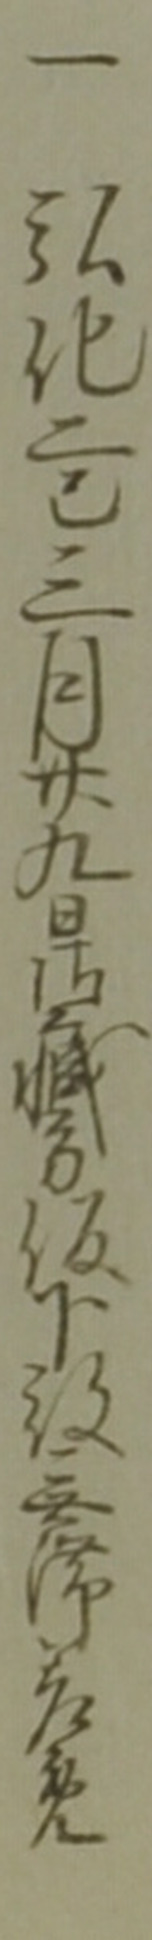一弘化二巳三月廿九日御蔵方仮下役無滞差免
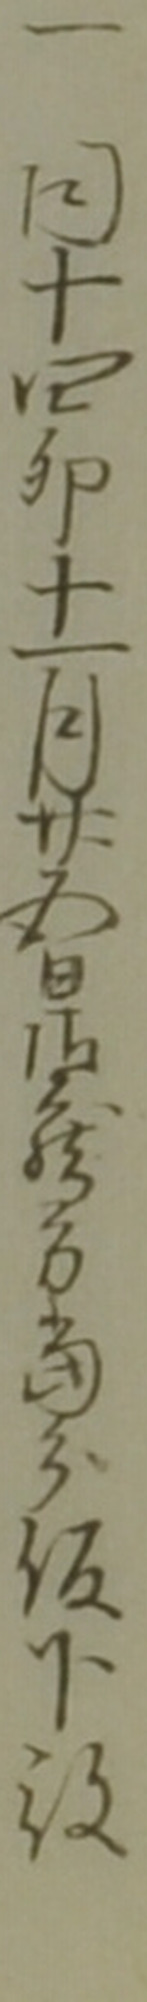一同十四卯十一月廿五日御蔵方当分仮下役
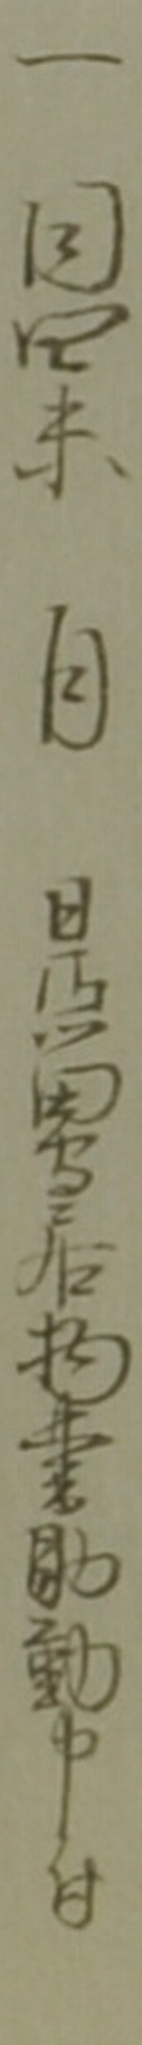一同四未月日御留守居物書助勤申付
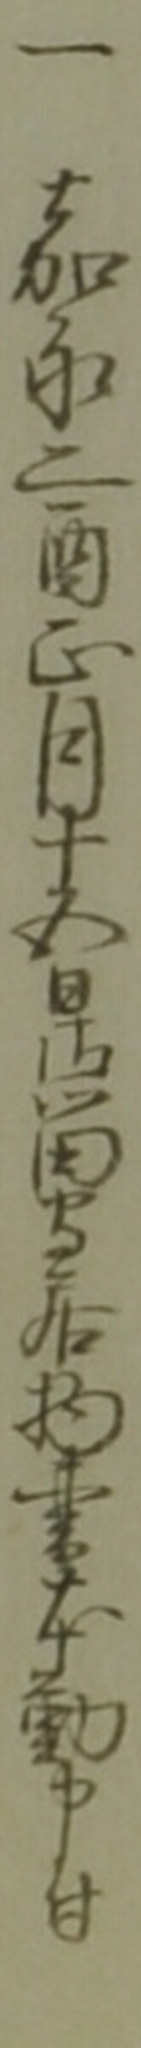一嘉永二酉正月十五日御留守居物書本勤申付

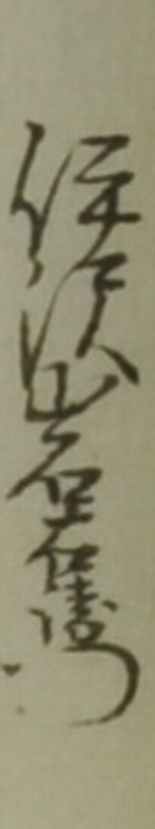伊沢岩右衛門
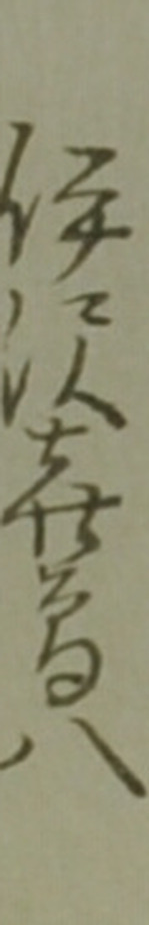伊沢喜曽八
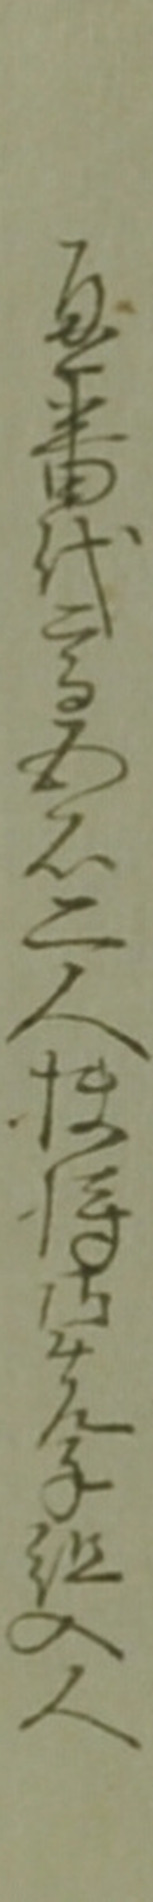通番代高五石二人扶持御先手組入人
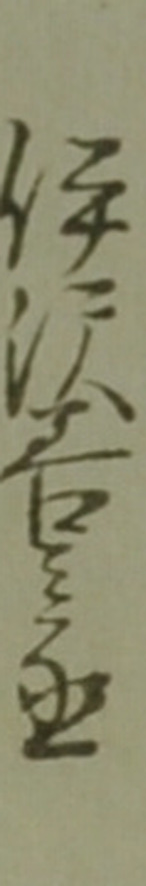伊沢善之丞

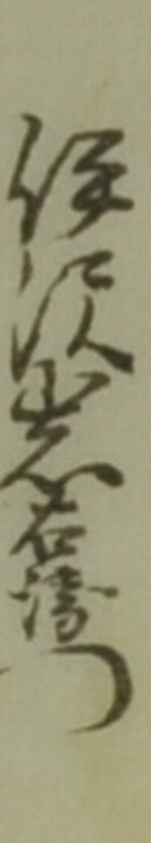伊沢岩右衛門
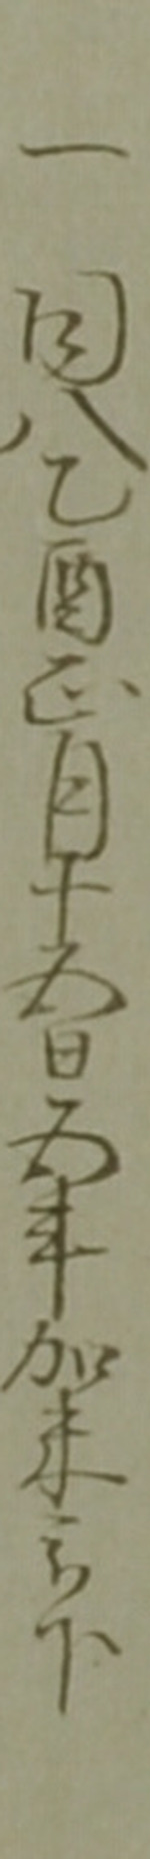一同八乙酉正月十五日五斗加米被下
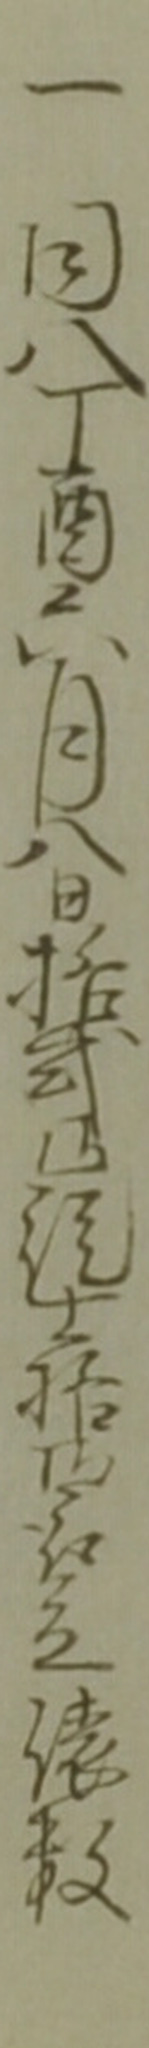一同八丁酉六月八日格式御徒士格御取立俵数
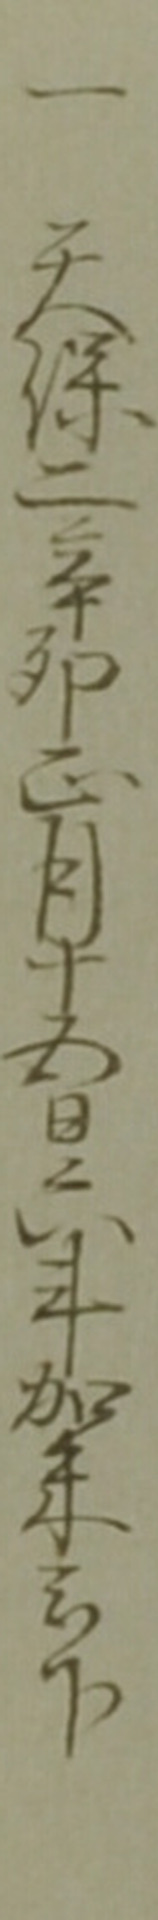一天保二辛卯正月十五日六斗加米被下
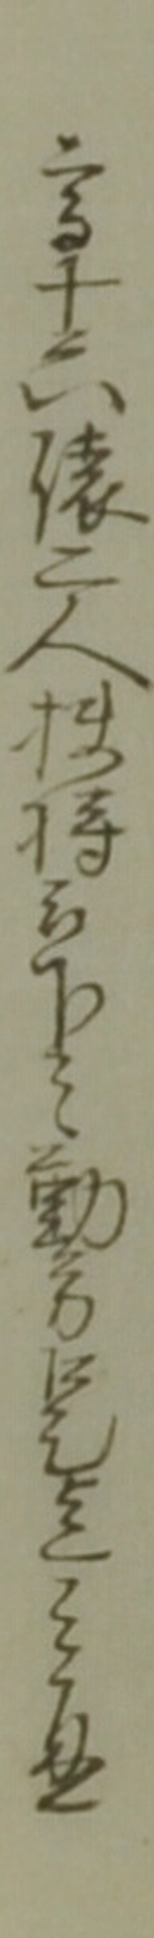高十六俵二人扶持被下之勤方是迄之通
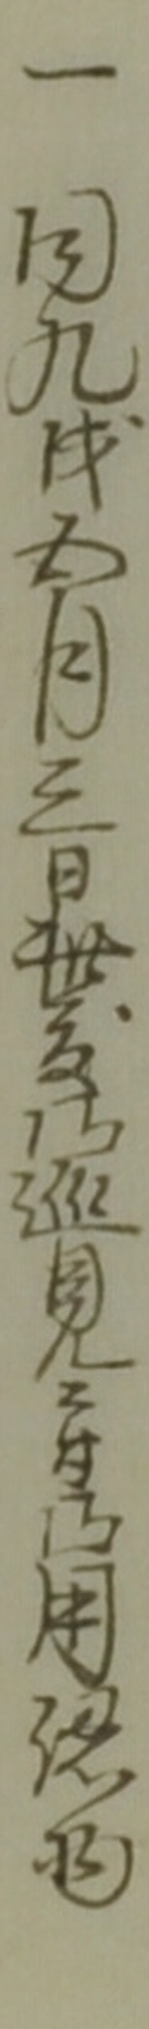一同九戌五月三日此度御巡見ニ付御用認物
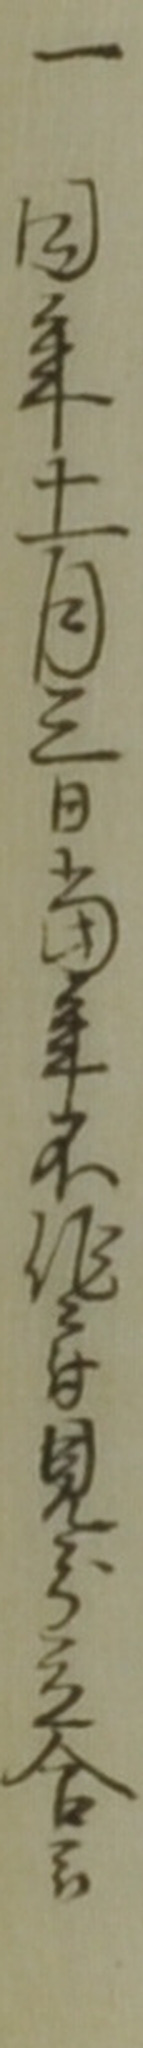一同年十一月三日当年不作ニ付見分立合被
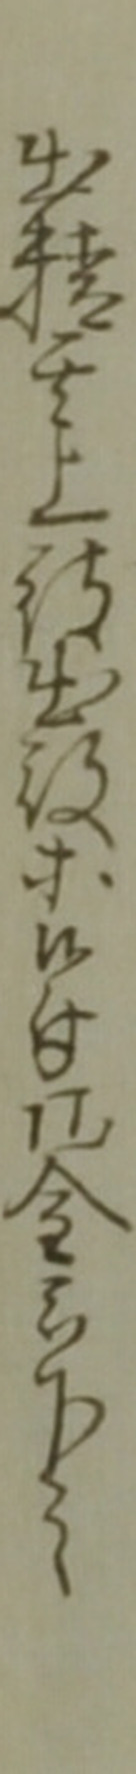出精其上致出役等候付御金被下之
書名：無足諸士勤仕録（九）
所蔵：伊那市立高遠町図書館・合同会社AMANE
